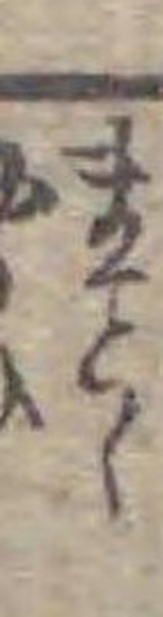まことゝ
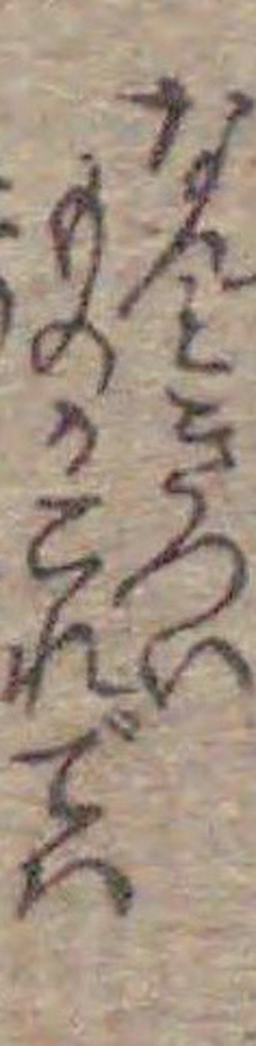ものかこれでは
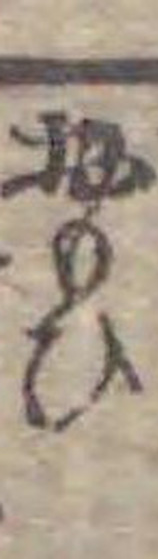おもひ
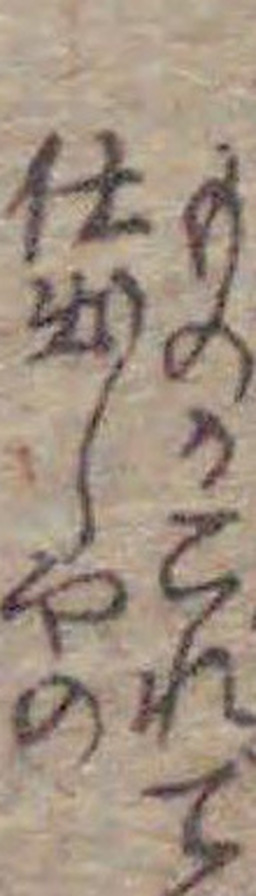仕出しやの
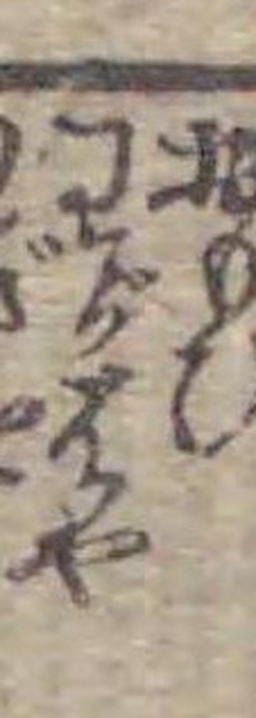わがはや
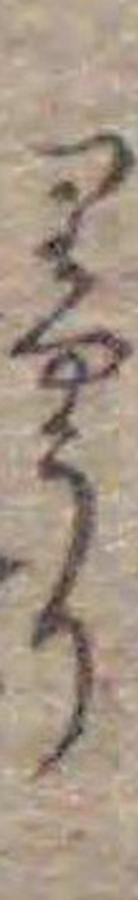りやうり
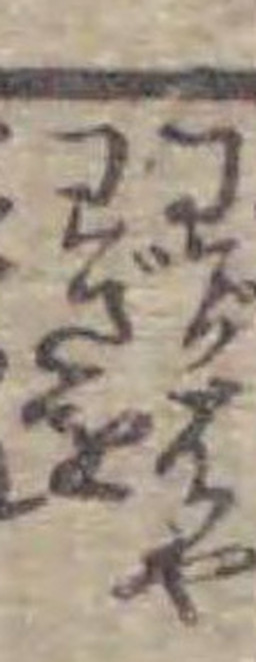わざを
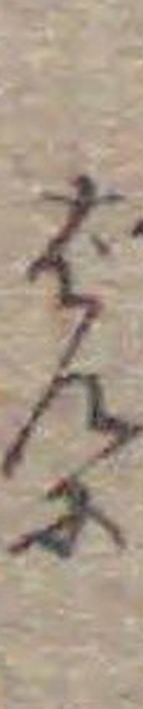ばんに
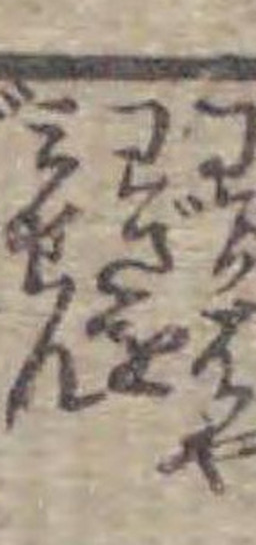みせん
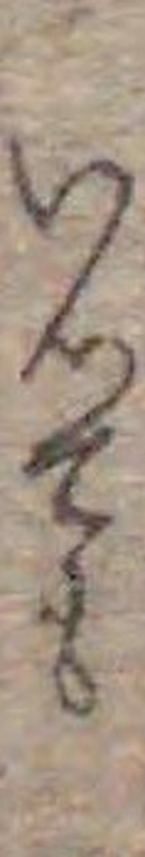いつても
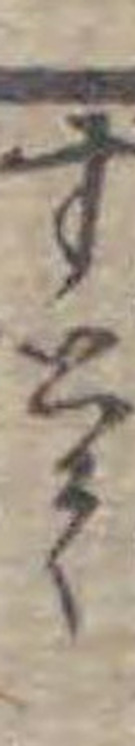ずとて
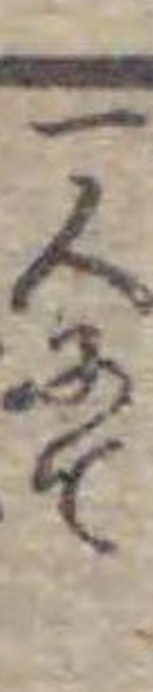一人にて
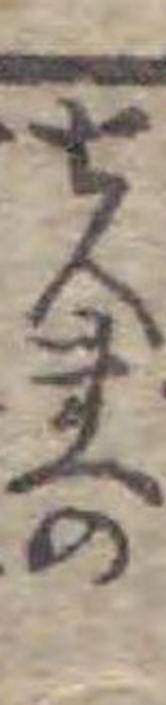七人まへの
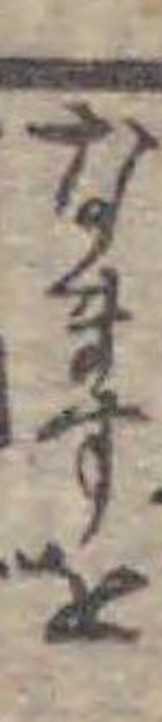なますを
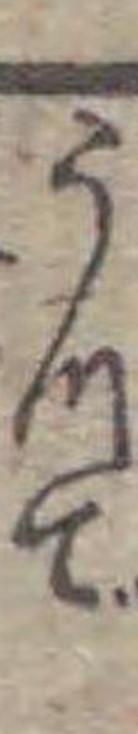うつて
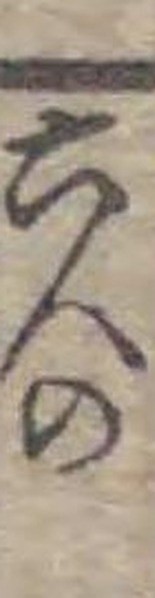六人の
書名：時代世話二挺皷 : 2巻
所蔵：国立国会図書館 National Diet Library, JAPAN
